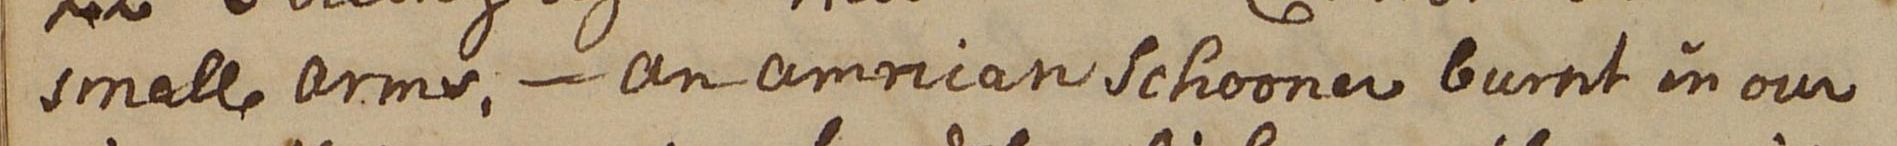small arms,- An Amrican Schooner burnt in our
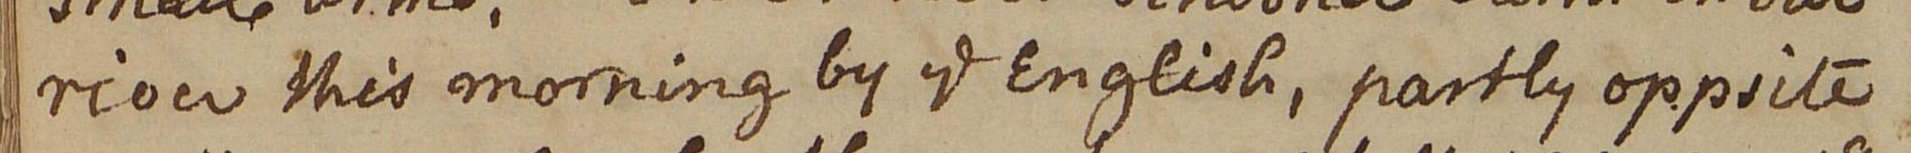river this morning by y^e English, partly oppsite
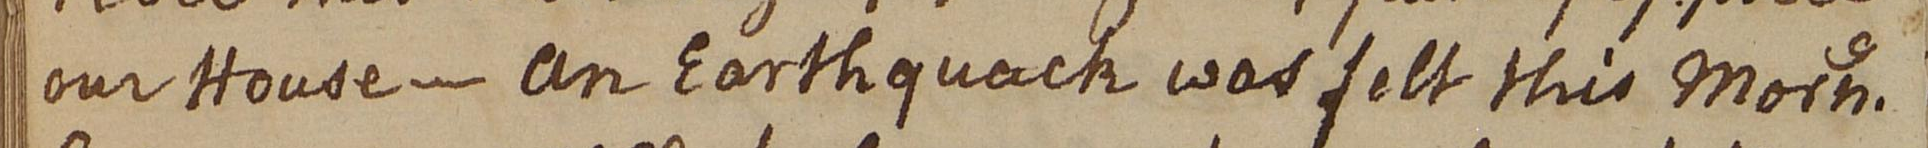our House- an Earthquack was felt this Morn^g.
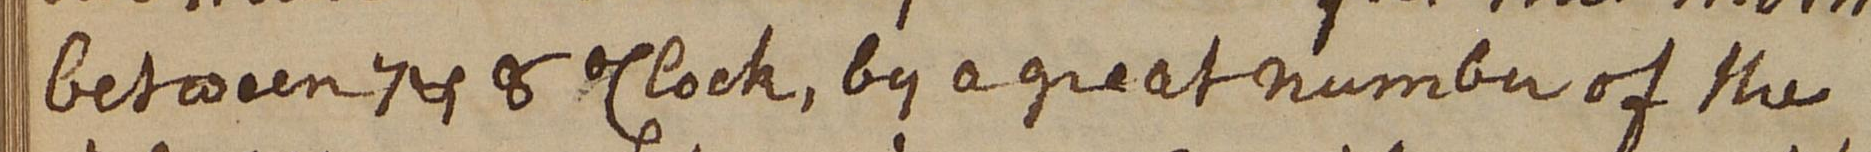between 7 & 8 ^oClock, by a great number of the
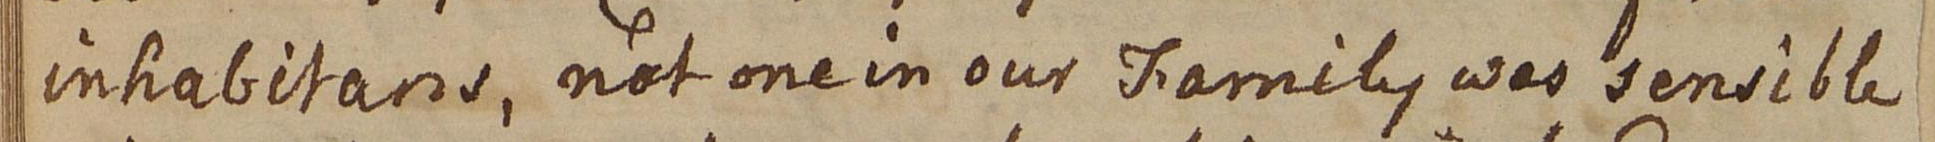inhabitans, not one in our Family was sensible
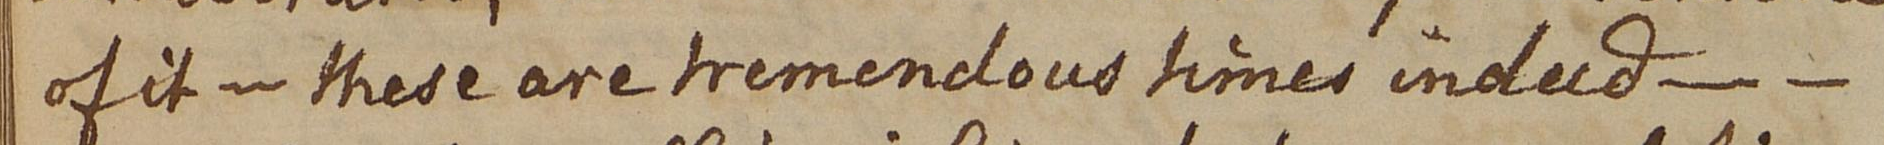of it- these are tremendous times indeed-
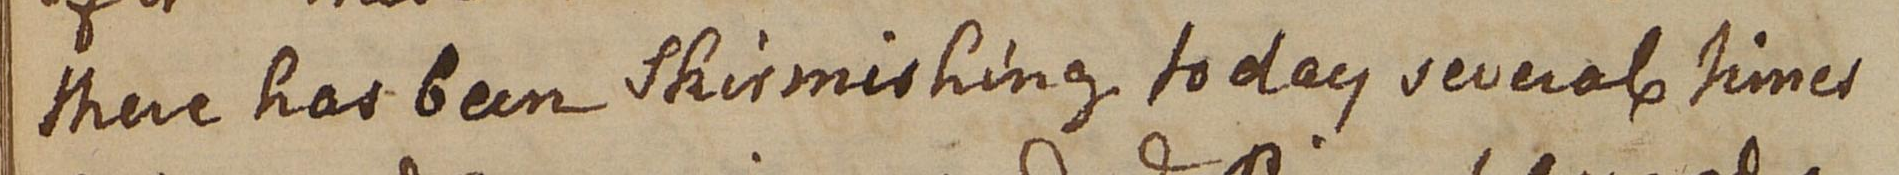there has been Skirmishing to day several times
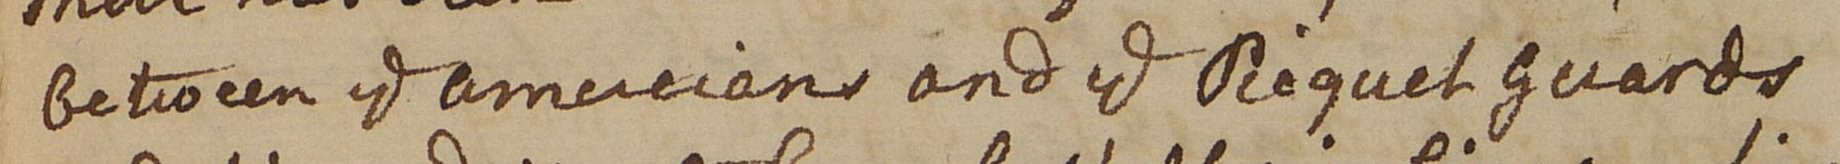between y^e Amercians and y^e Piquet guards
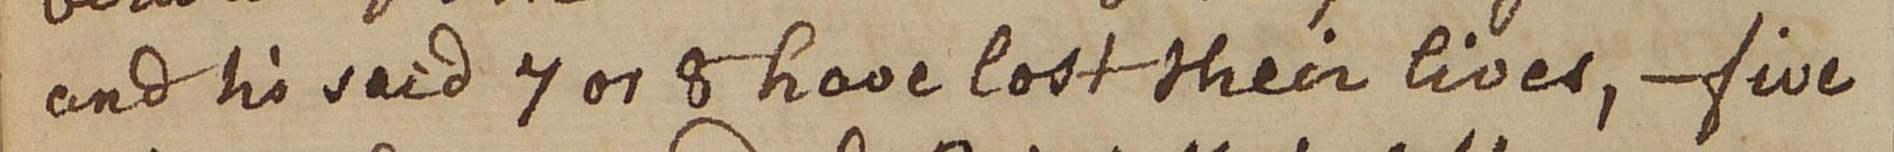and tis said 7 or 8 have lost their lives,- five
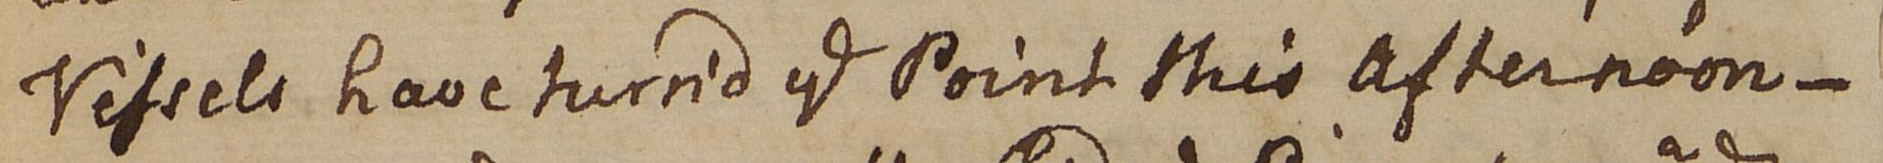Vessels have turn'd y^e Point this after noon-
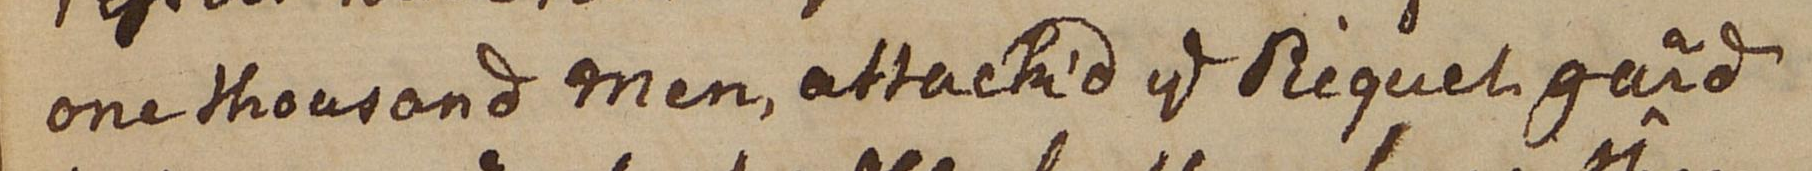one thousand men, attack'd y^e Riquet gu^ard
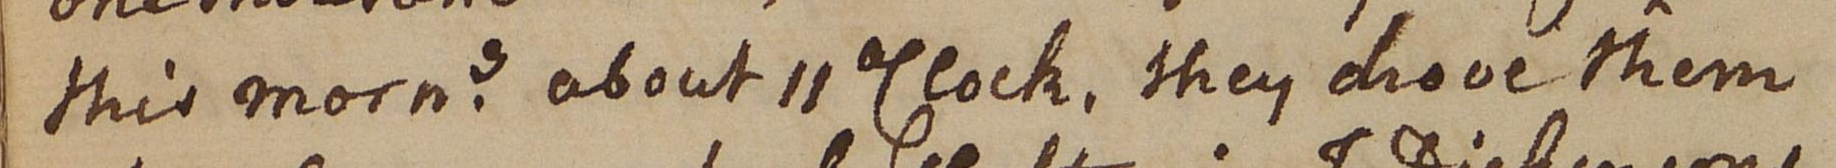this morn^g. about 11 oClock, they drove them
